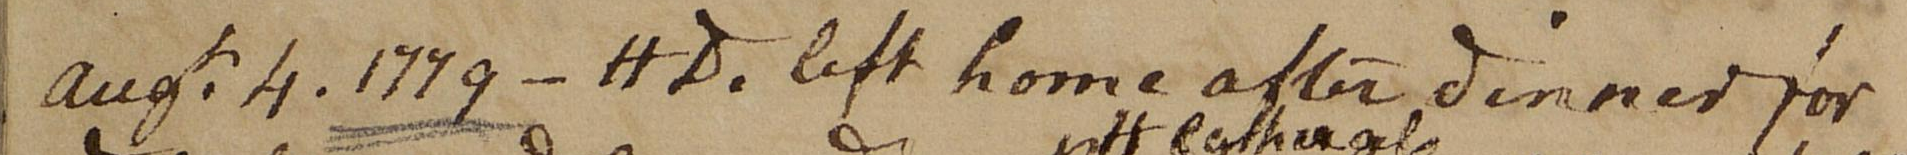Aug^t. 4. 1779- HD. left home after dinner for
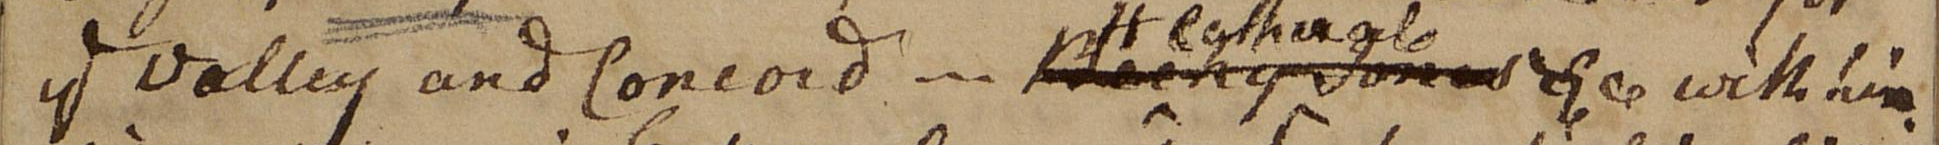y^e Valley and Concord- [Becky Jones] ^ &c with him
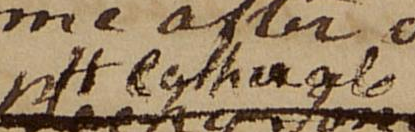H Catheral
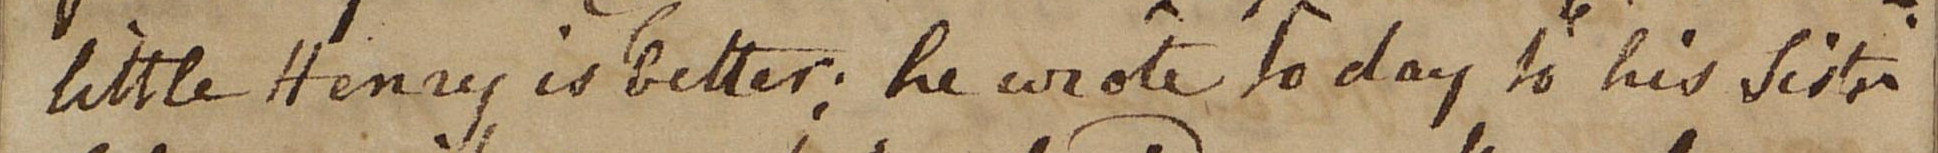little Henry is better; he wrote to day to his Sister
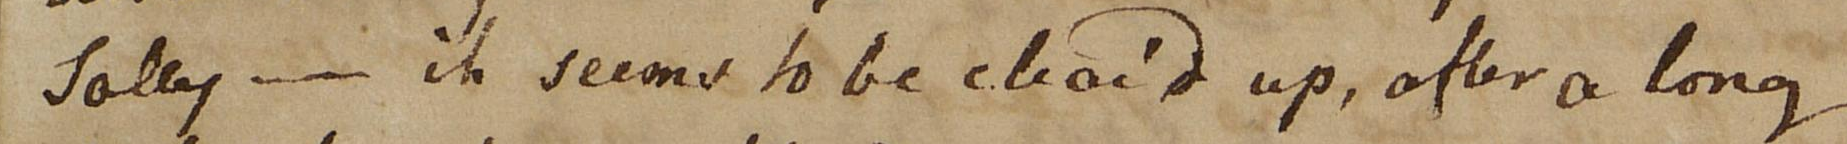Sally- it seems to be clear'd up, after a long
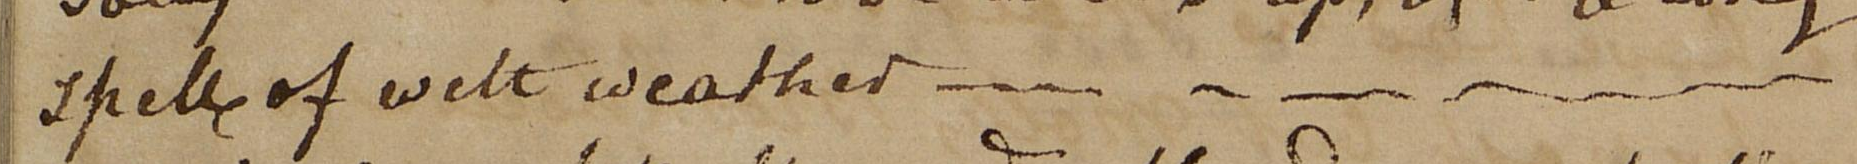spell of wett weather-----
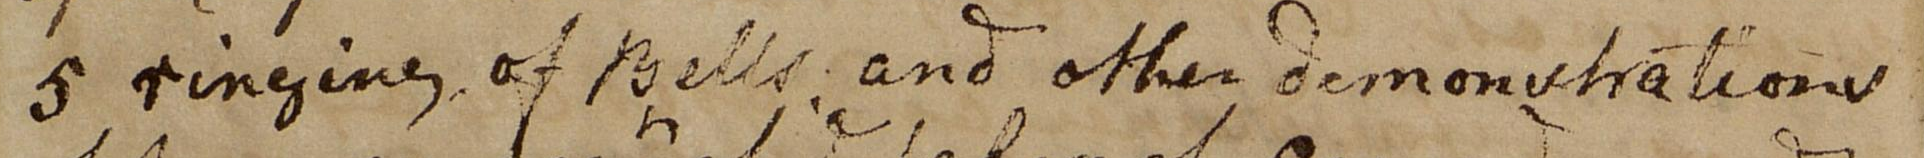5 ringing of Bells; and other demonstrations
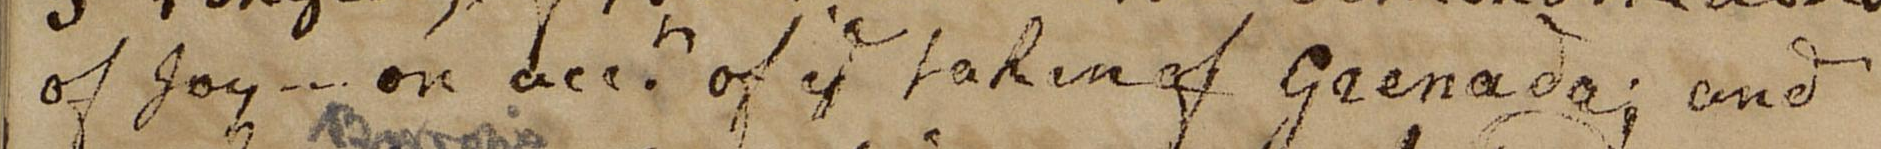of Joy- on acc^t. of y^e taken of Grenada; and
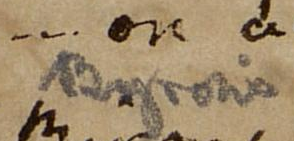Begrons
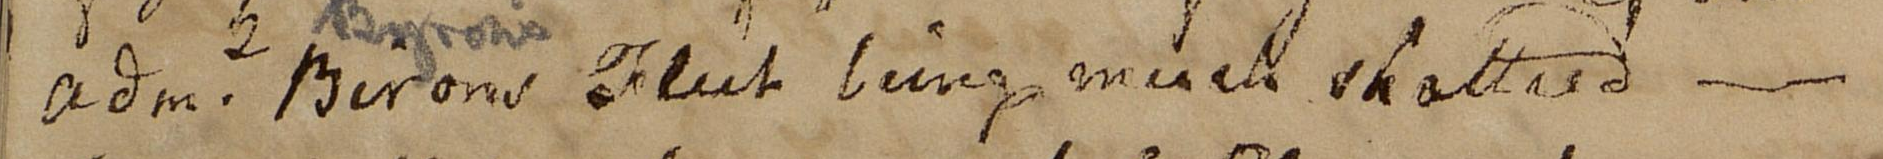Adm^l. Birons Fleet being much shattred-
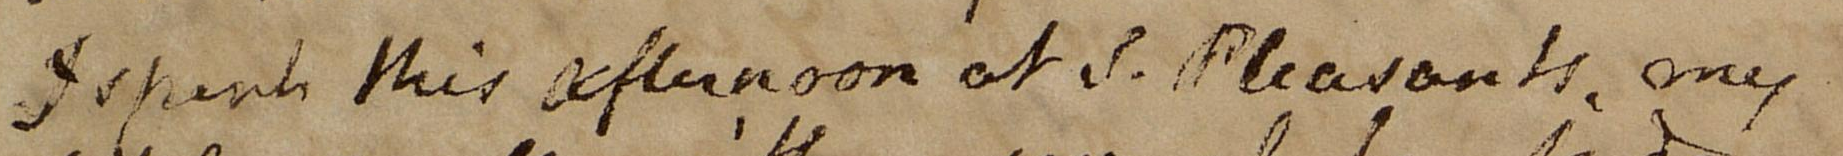I spent this afternoon at S. Pleasants, my
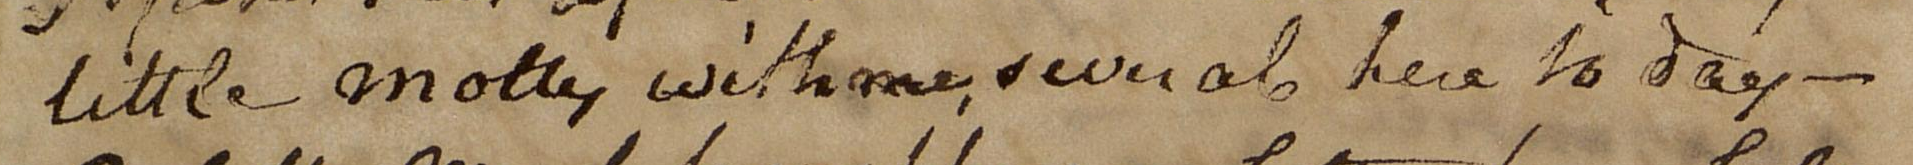little Molly with me, several here to day-
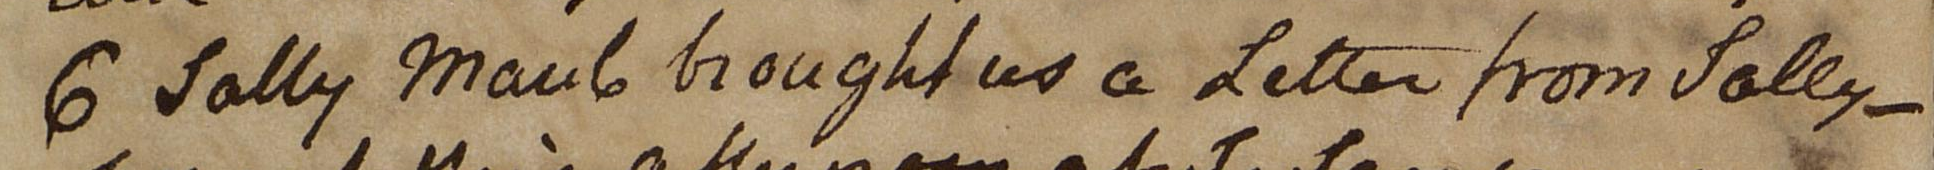6 Sally Maul brought us a Letter from Sally-
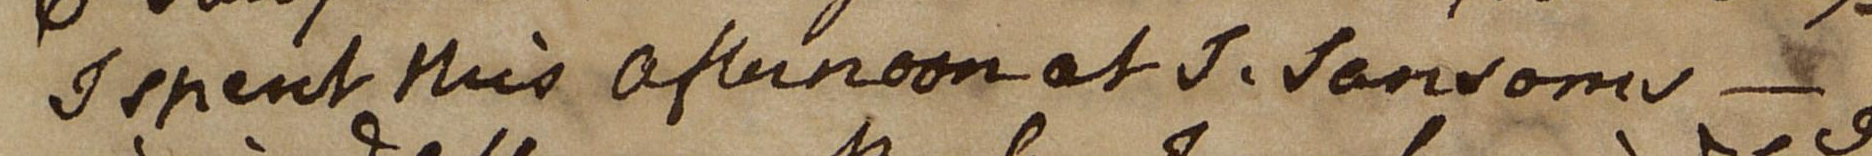I spent tis afternoon at S. Sansoms-
